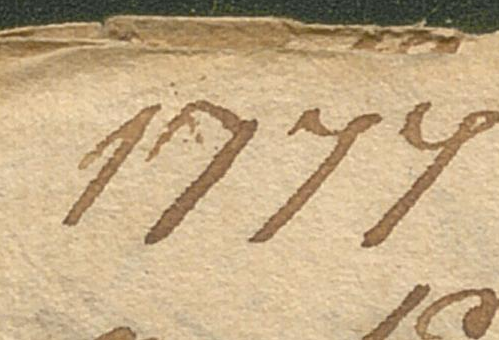1777
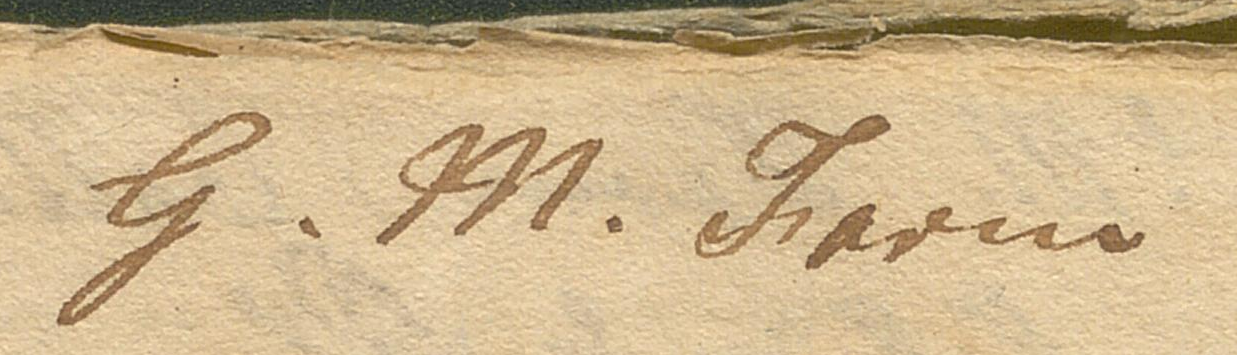G. M. Farm
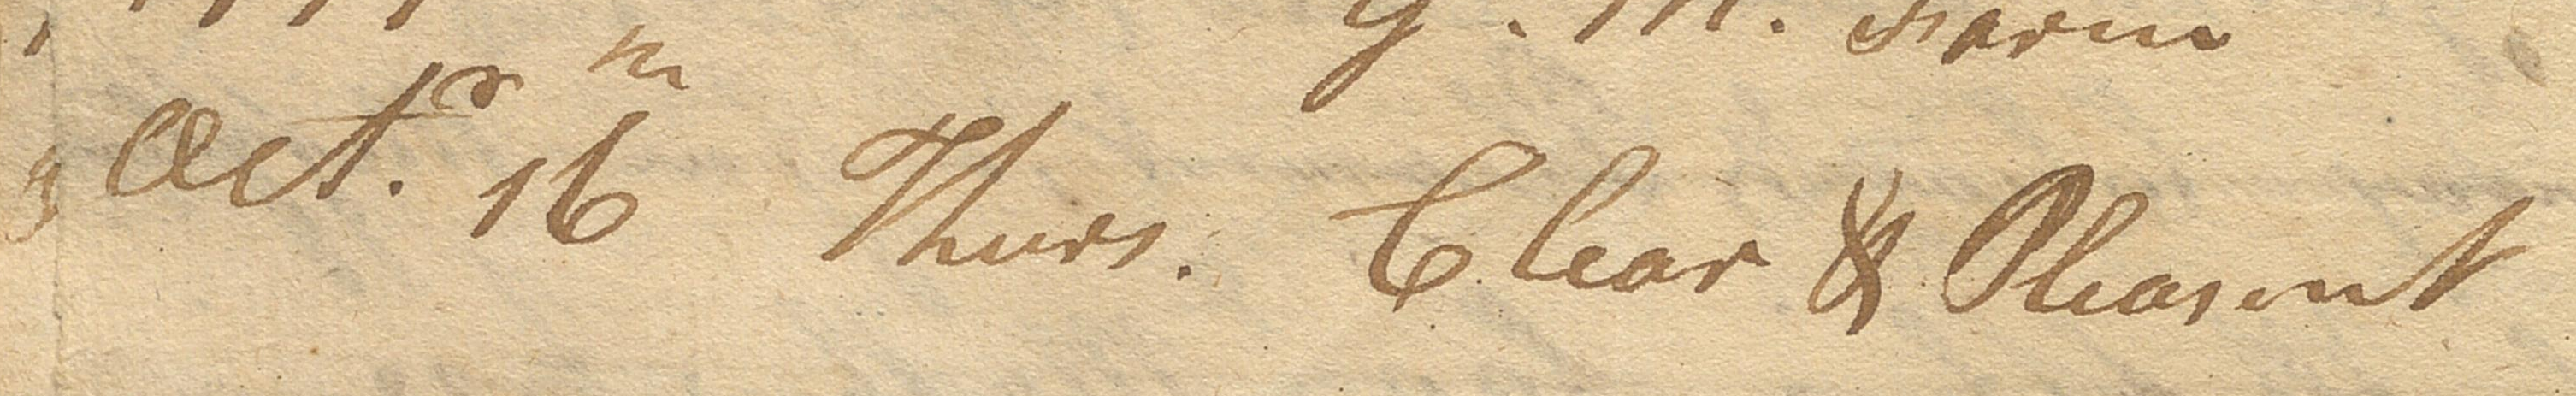Oct^r. 16 Thurs. Clear & Pleasent
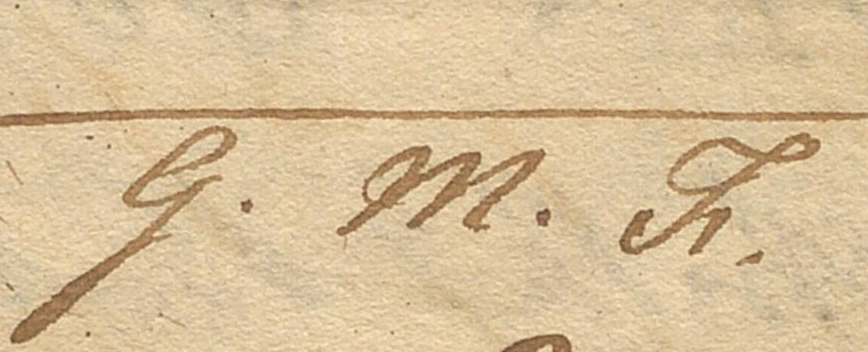G. M. F.
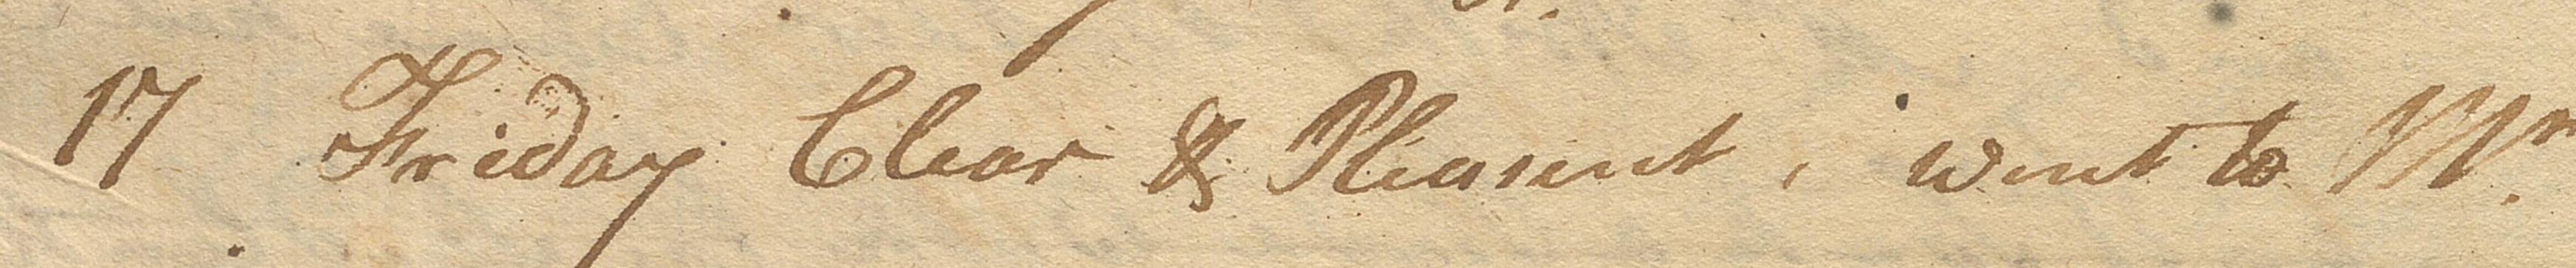17 Friday Clear & Pleasent, went to M^r.
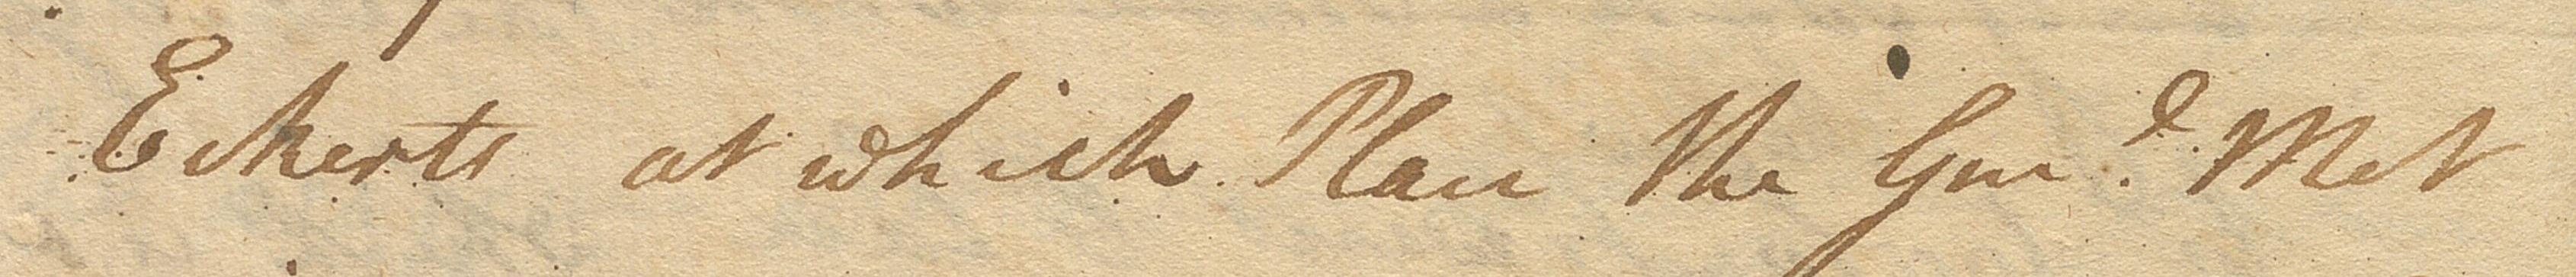Eckerts at which Place the Gen^l. Met
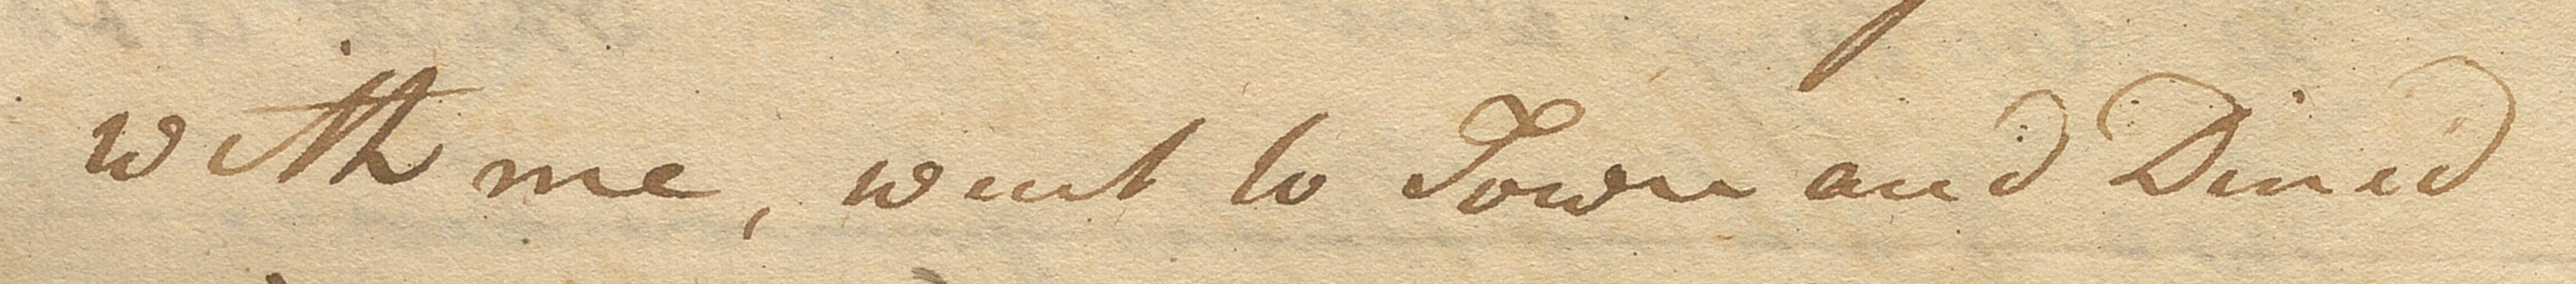with me went to Town and Dined
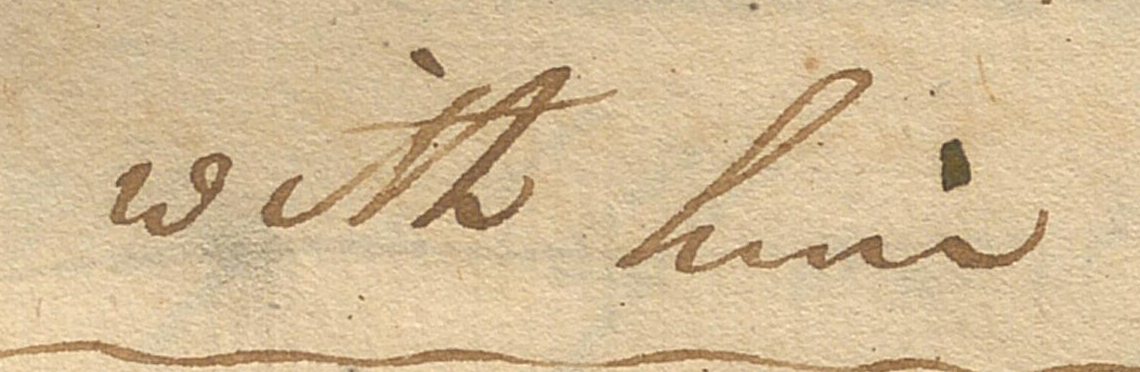with him
